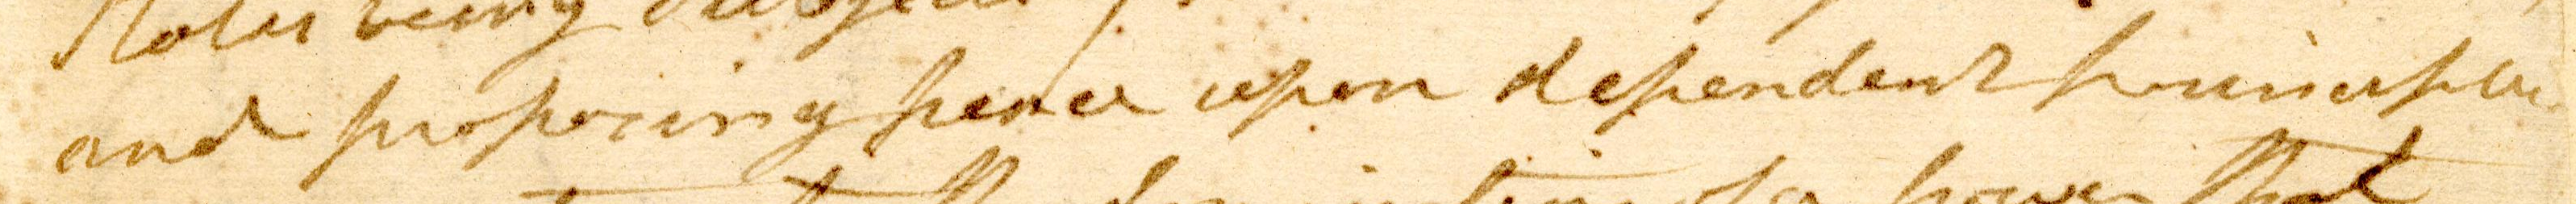and proposing pence upon dependent principle
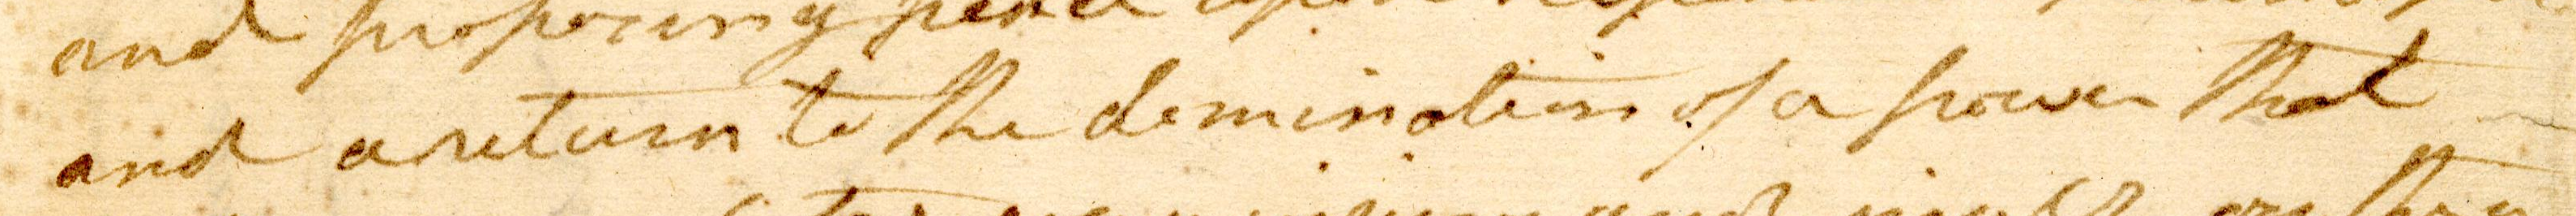and a return to the deminotion of a power that
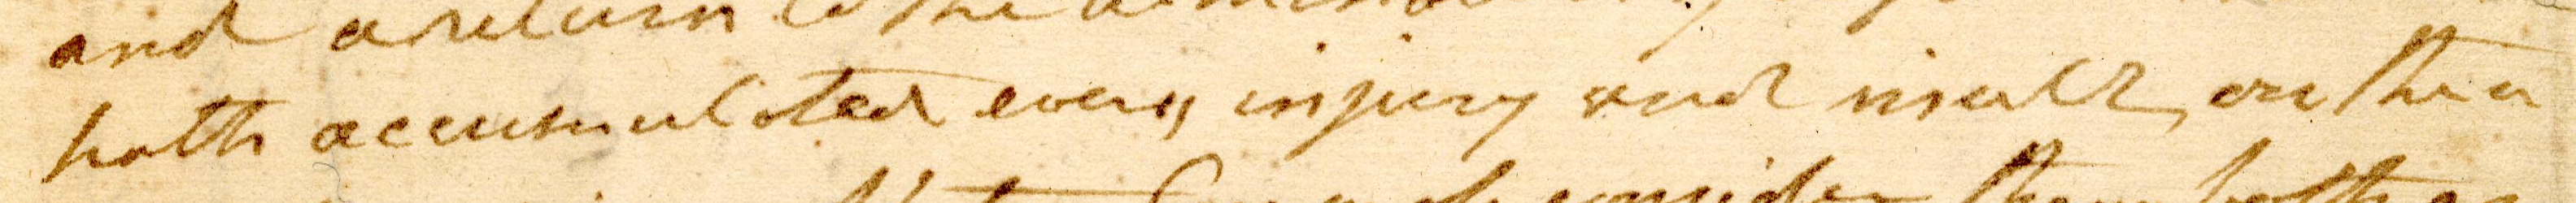hath accumulated every injury and insult on these
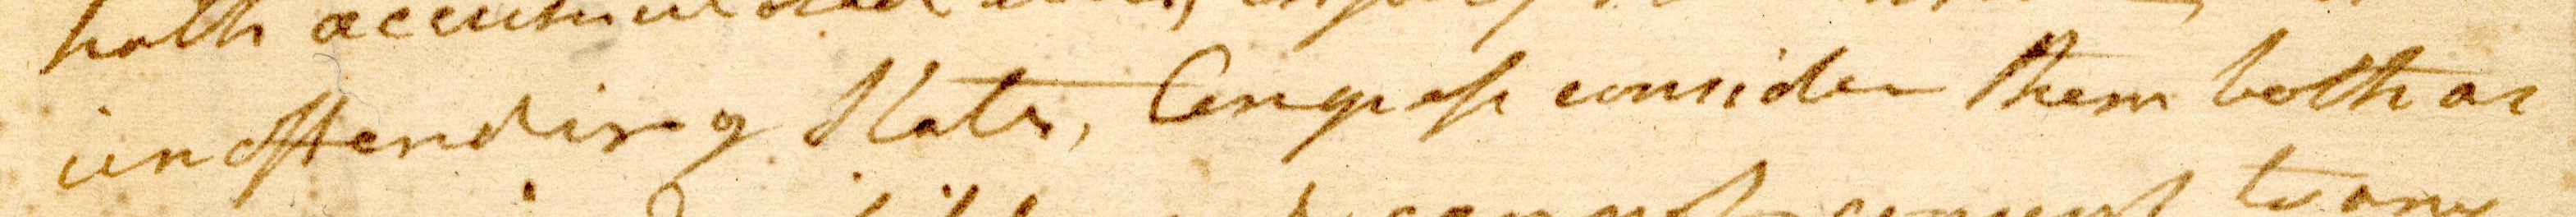unoffending States, Congress consider them both as
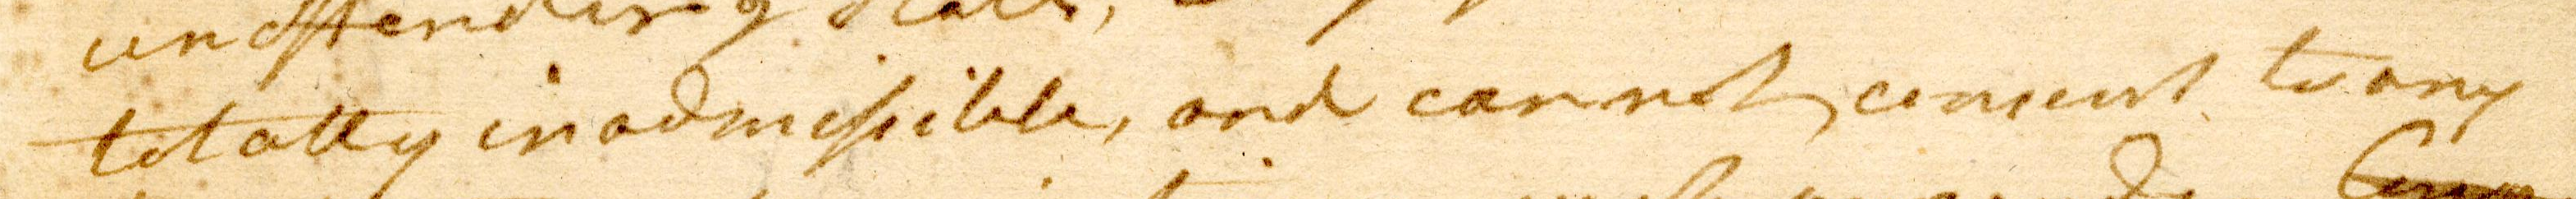totally inadmissible, and cannot consent to any
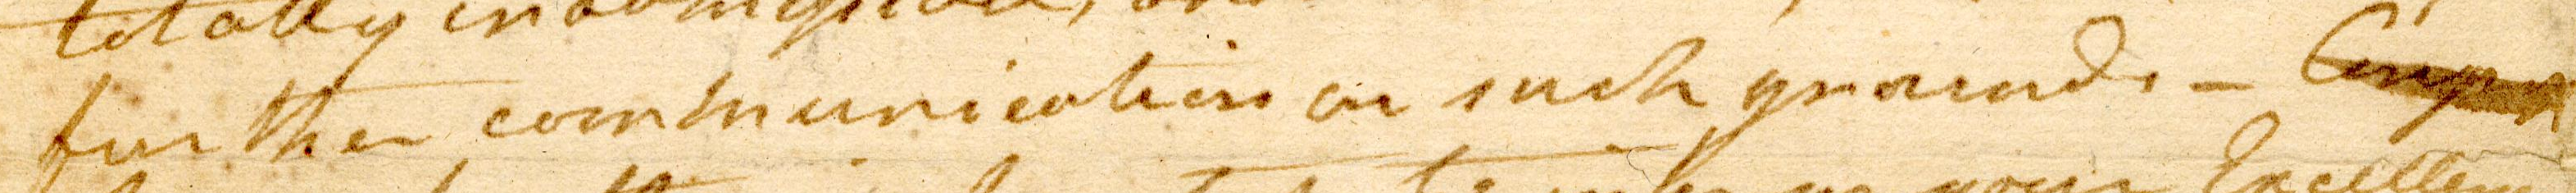further communications on such grounds- [Cong]
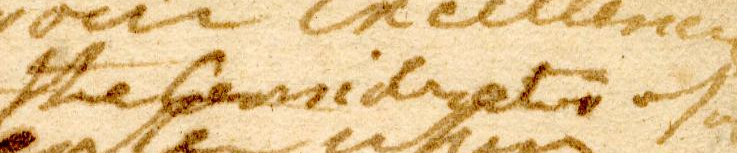the Considerates of a
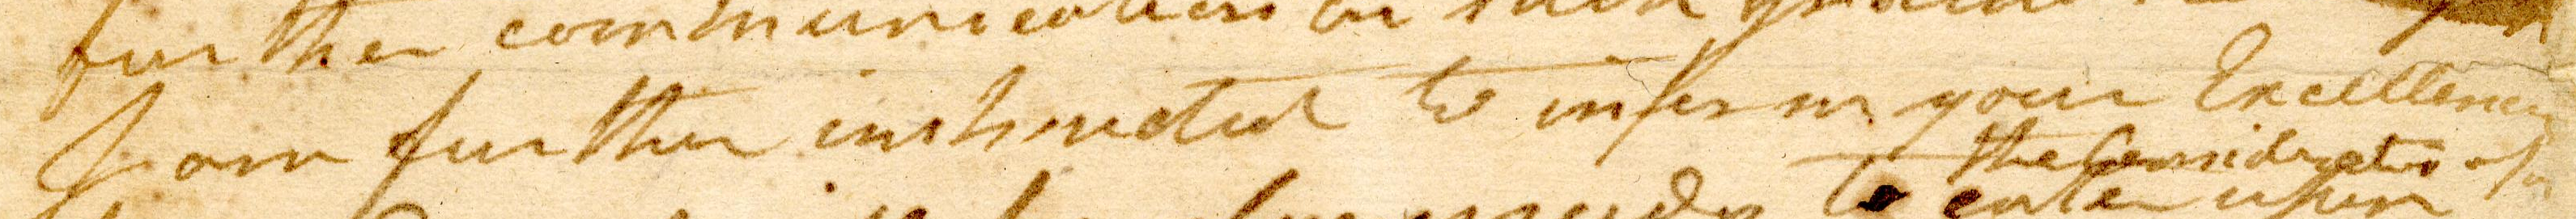I am further instructed to inform in your Excellency
